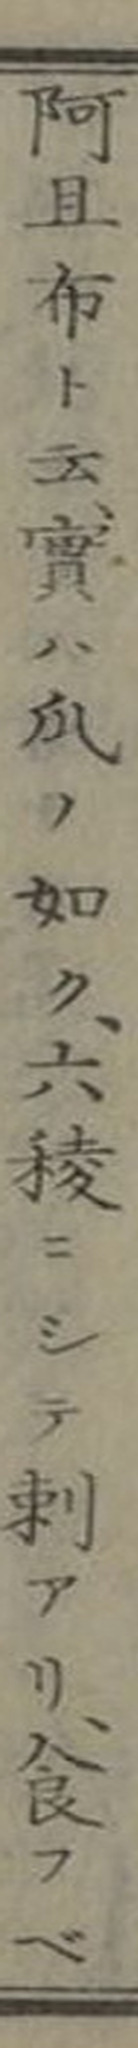阿旦布ト云、実ハ瓜ノ如ク、六稜ニシテ剌アリ、食フベ
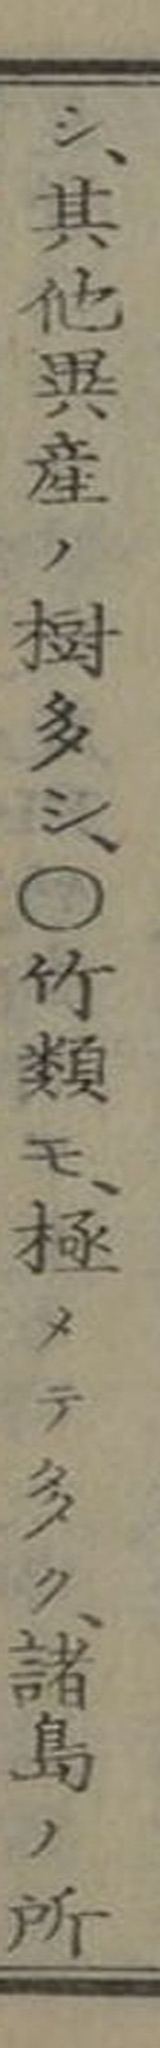シ、其他異産ノ樹多シ、○竹類モ、極メテ多ク、諸島ノ所

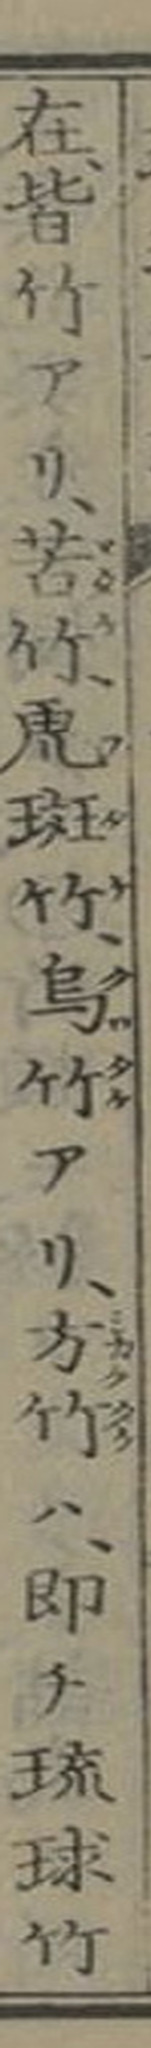在、皆竹アリ、苦竹、虎斑竹、烏竹アリ、方竹ハ、即チ琉球竹
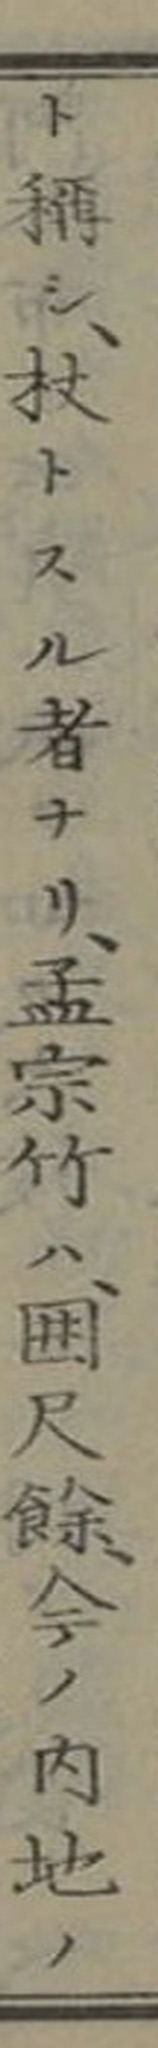ト称シ、杖トスル者ナリ、孟宗竹ハ、囲尺余、今ノ内地ノ
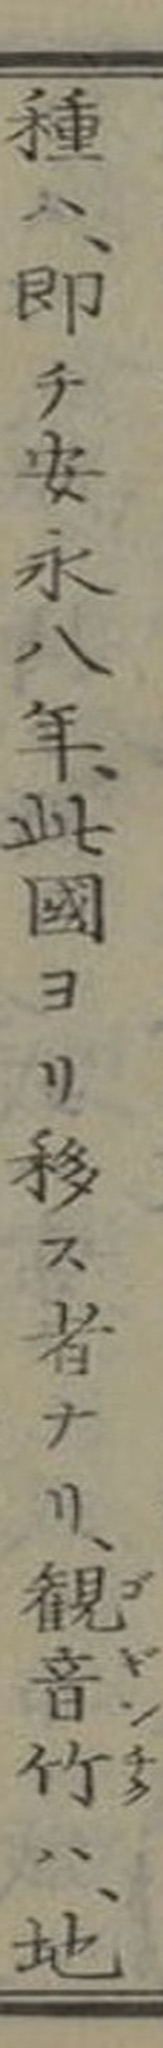種ハ、即チ安永八年、此国ヨリ移ス者ナリ、観音竹ハ、地
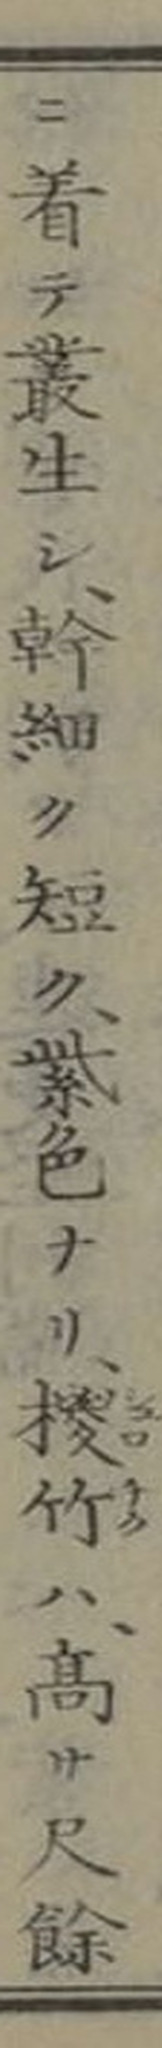ニ着テ叢生シ、幹細ク短ク、紫色ナリ、棕竹ハ、高サ尺余
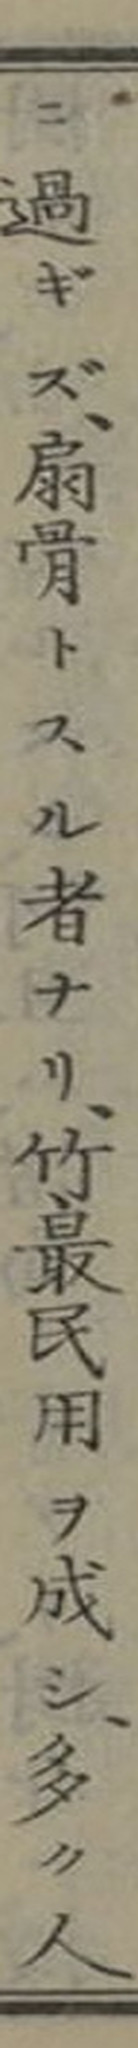ニ過ギズ、扇骨トスル者ナリ、竹最民用ヲ成シ、多ク人
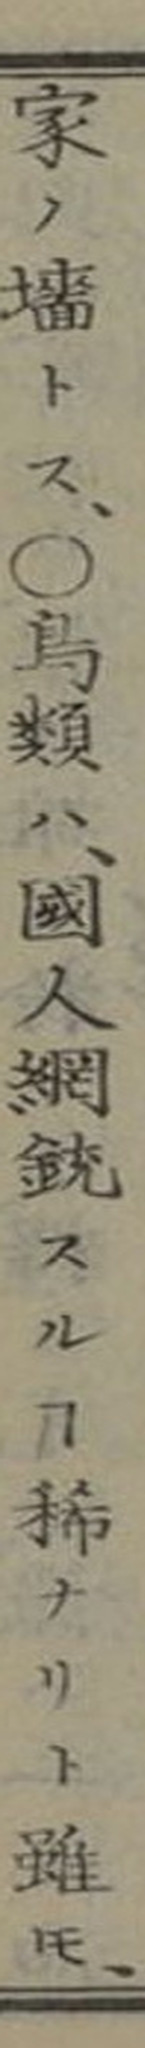家ノ牆トス、○鳥類ハ、国人網銃スルヿ稀ナリト雖トモ、
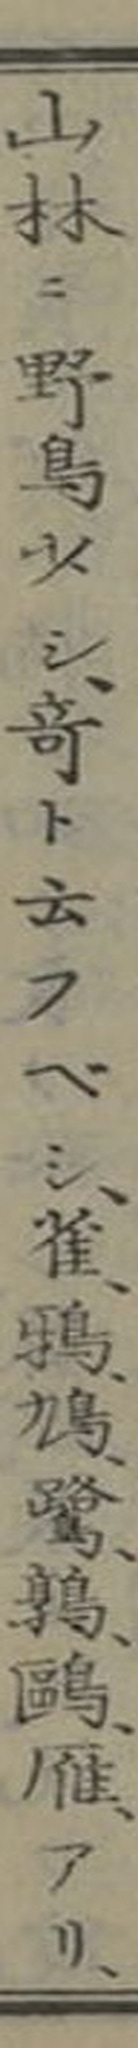山林ニ野鳥少シ、奇ト云フベシ、雀、鴉、鳩、鷺、鶉、鷗、雁、アリ、
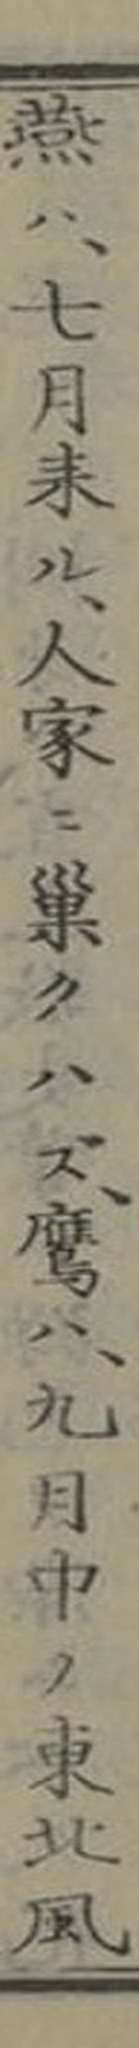燕ハ、七月来ル、人家ニ巣クハズ、鷹ハ、九月中ノ東北風
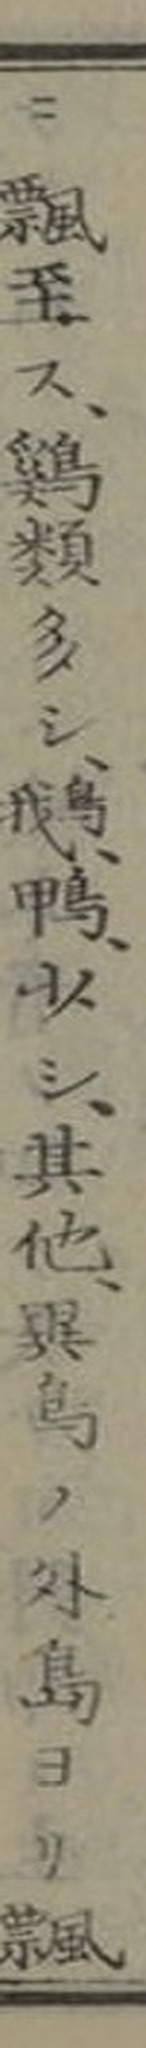ニ飄至ス、鶏類多シ、鵝、鴨、少シ、其他、異鳥ノ外島ヨリ飄
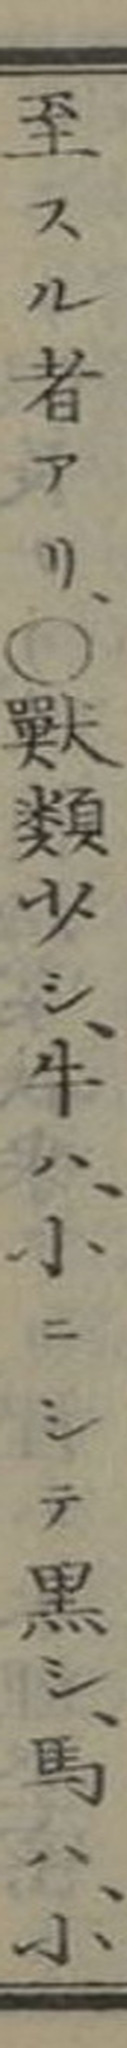至スル者アリ、○獣類少シ、牛ハ、小ニシテ黒シ、馬ハ、小
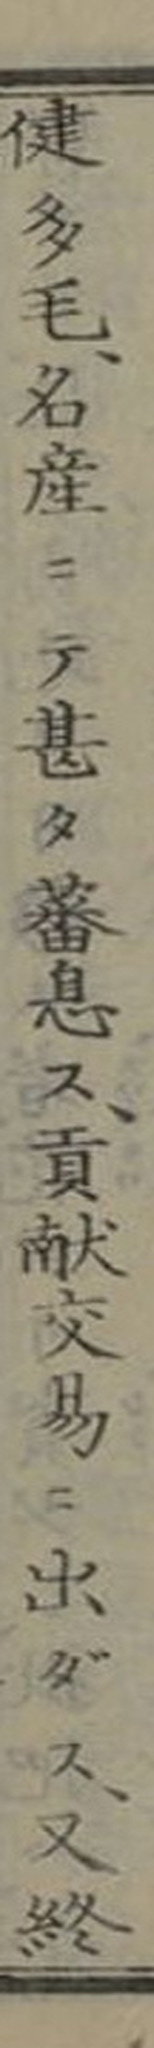健多毛、名産ニテ甚タ蕃息ス、貢献交易ニ出ダス、又終
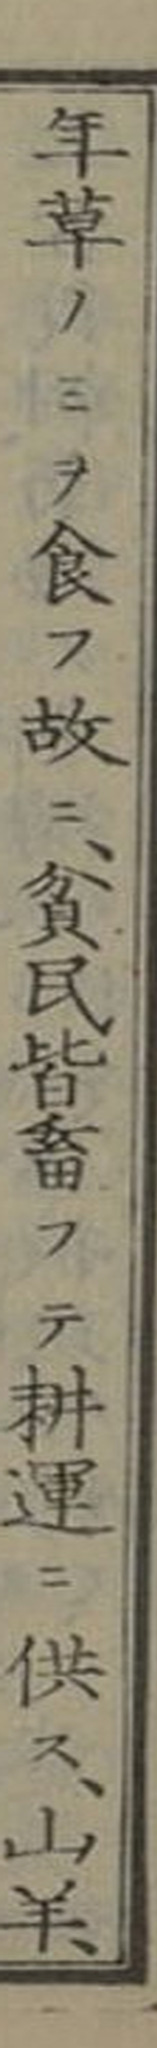年草ノミヲ食フ故ニ、貧民皆畜フテ耕運ニ供ス、山羊、
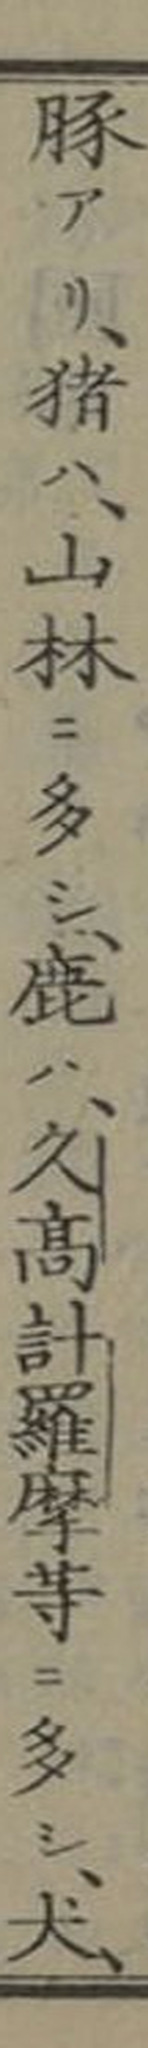豚アリ、猪ハ、山林ニ多シ、鹿ハ、久高計羅摩等ニ多シ、犬、
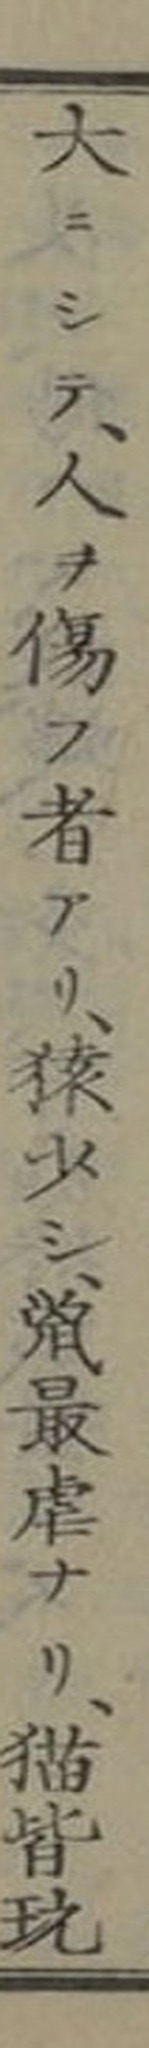大ニシテ、人ヲ傷フ者アリ、猿少シ、鼠最虐ナリ、猫皆玩
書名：琉球新誌 図附 上
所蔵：University of the Ryukyus Library
